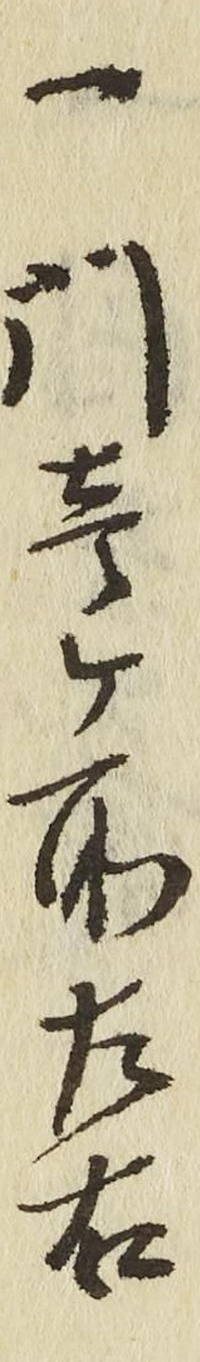一門壱ヶ所左右損
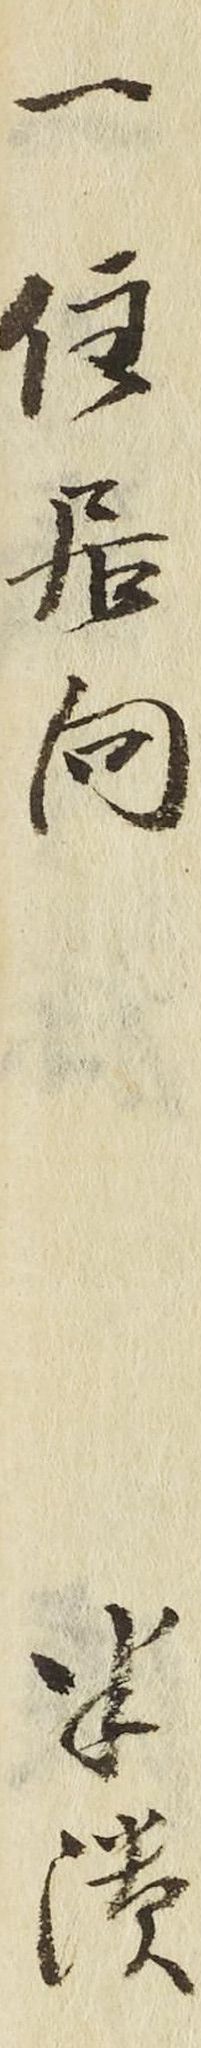一住居向半潰
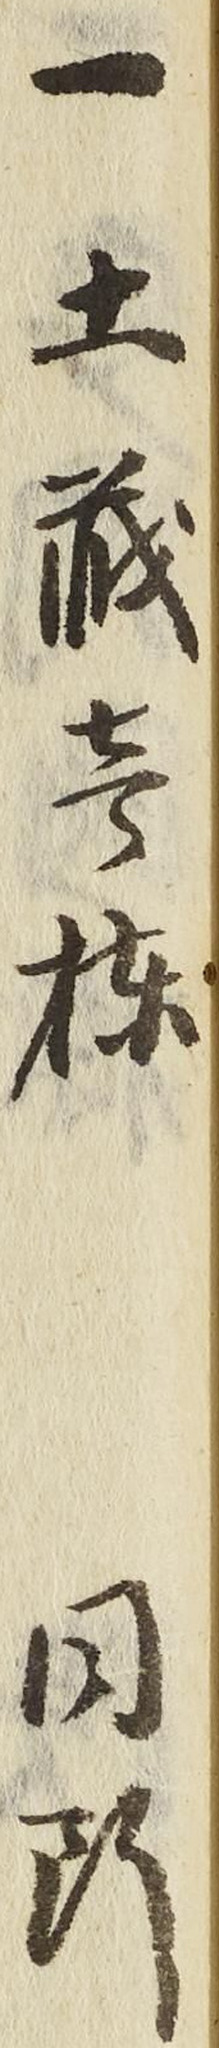一土蔵壱棟同断
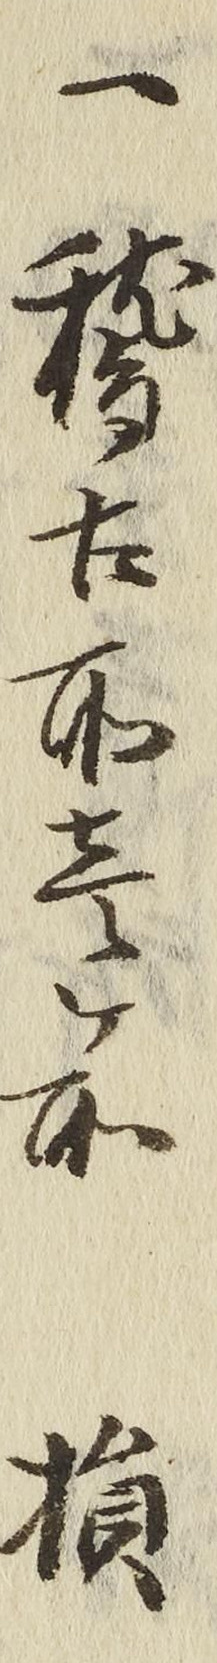一稽古所壱ヶ所損
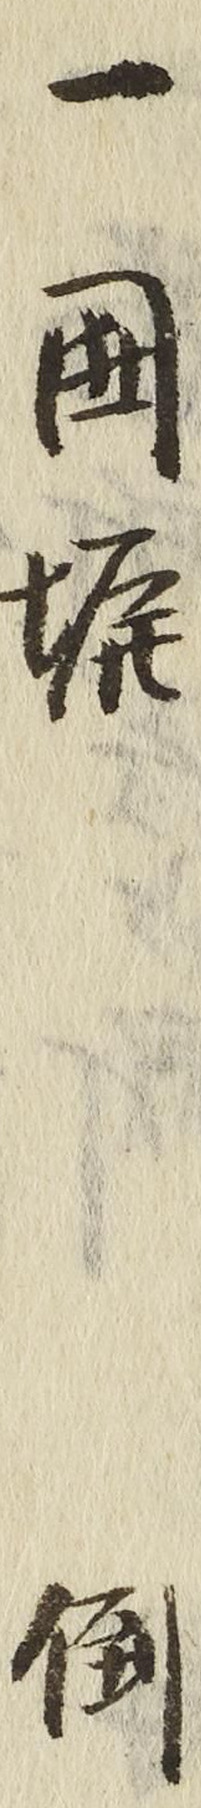一囲塀倒
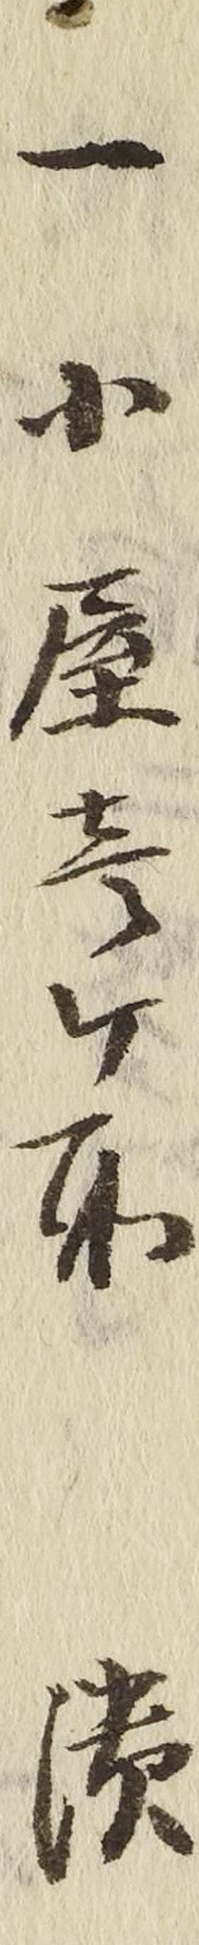一小屋壱ヶ所潰
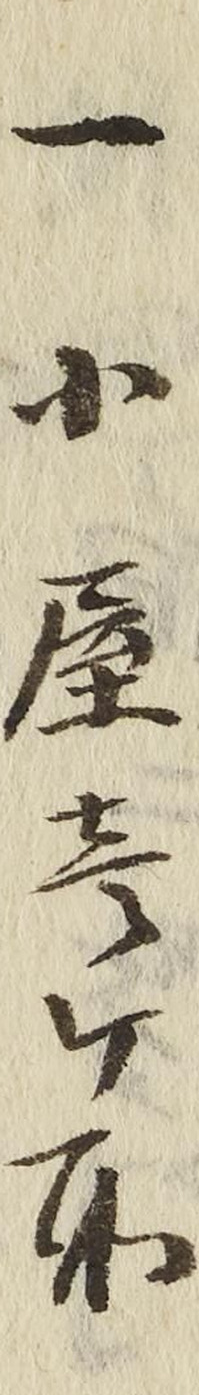一小屋壱ヶ所潰
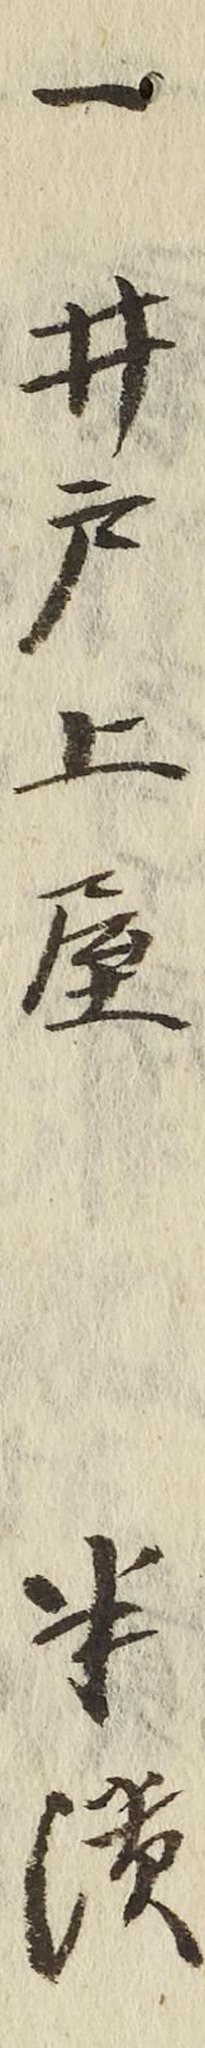一井戸上屋半潰
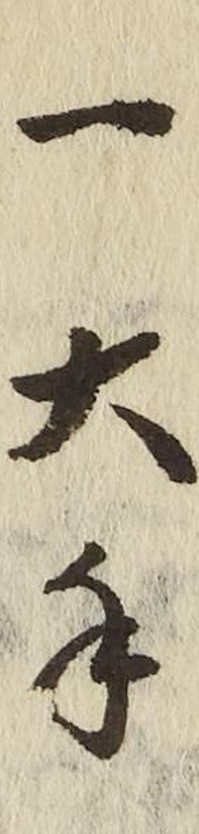一大手
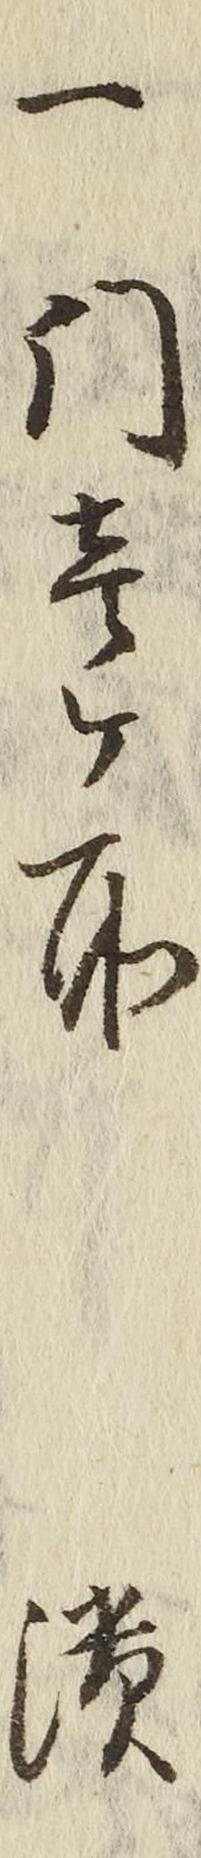一門壱ヶ所潰
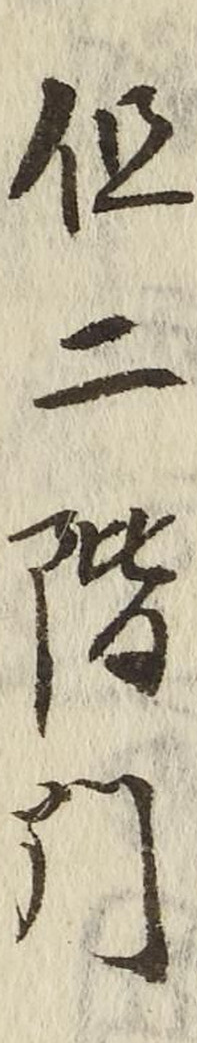但二階門
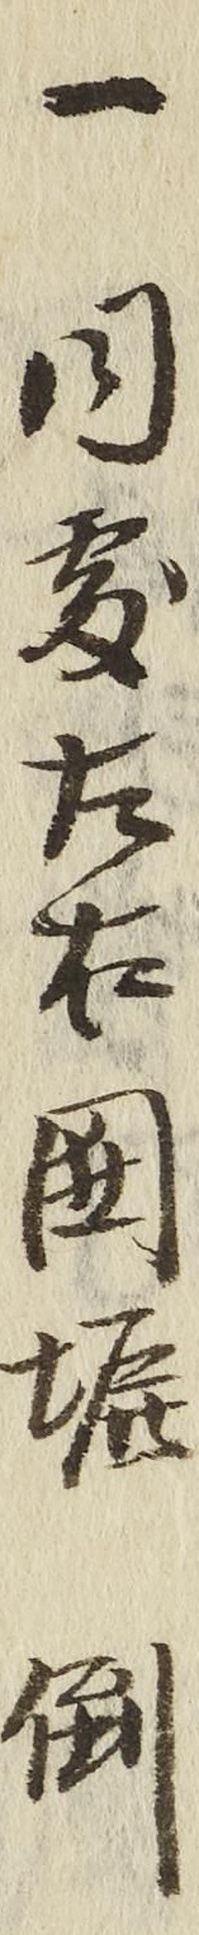一同処左右囲塀倒
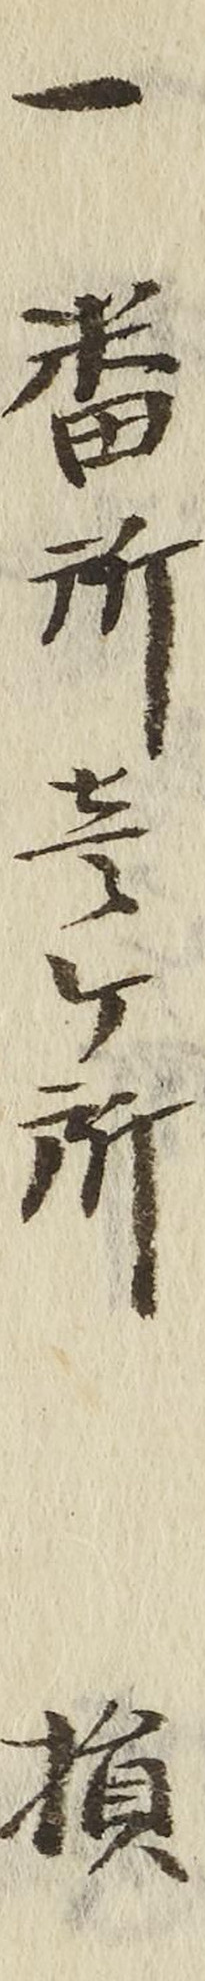一番所壱ヶ所損
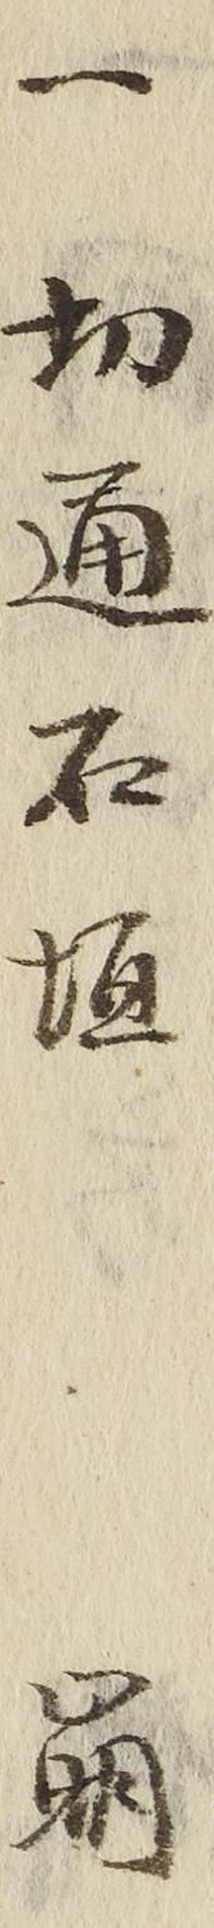一切通石垣崩
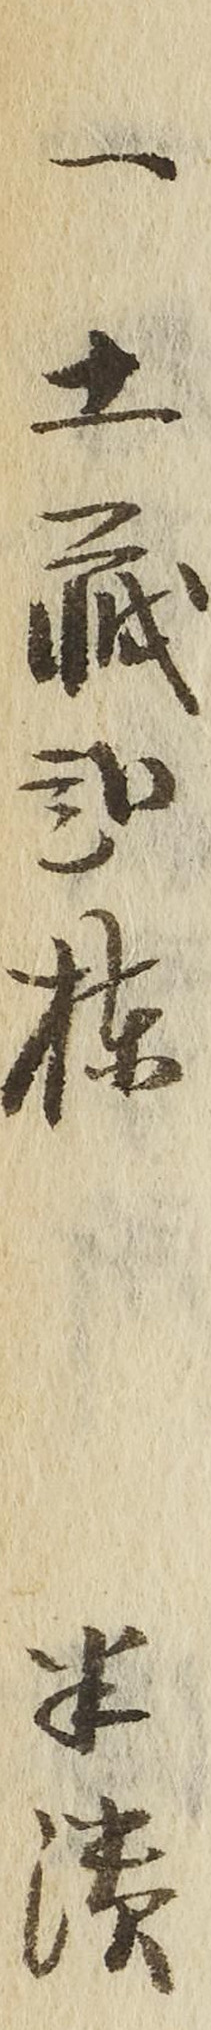一土蔵弐棟半潰

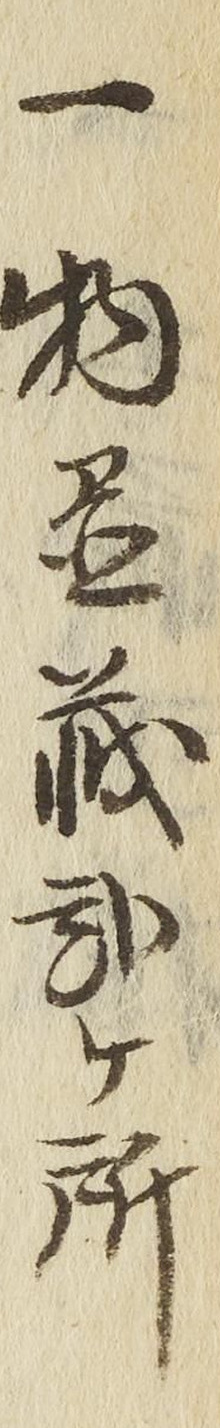一物置蔵弐ヶ所潰
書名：信濃國大地震記　乾
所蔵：東京大学地震研究所図書室 Earthquake Research Institute Library, The University of Tokyo, JAPAN
